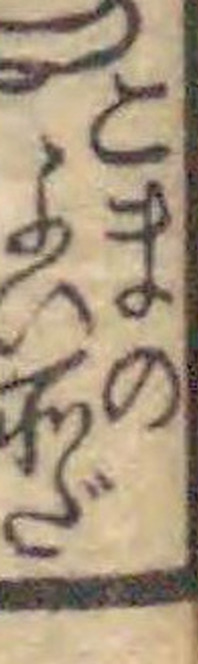よい所だ
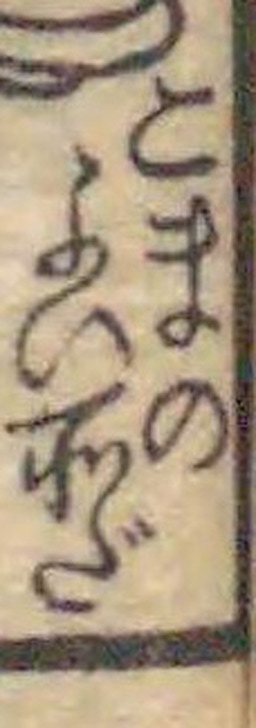よい所だ
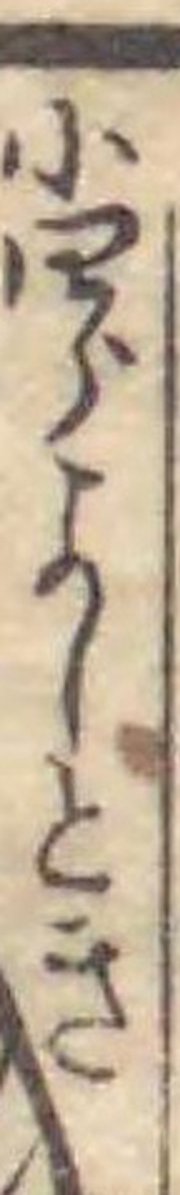小四郎よしとき
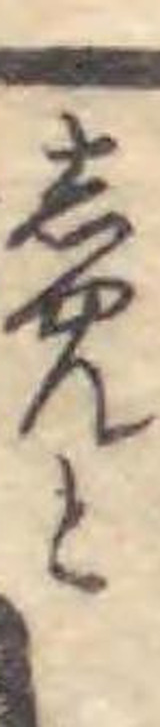しやんと
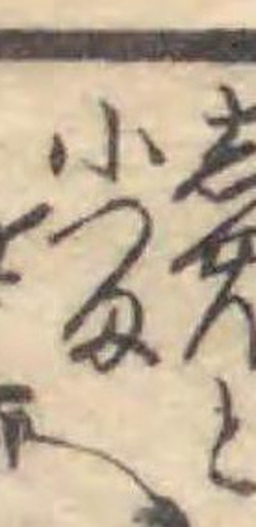小つま
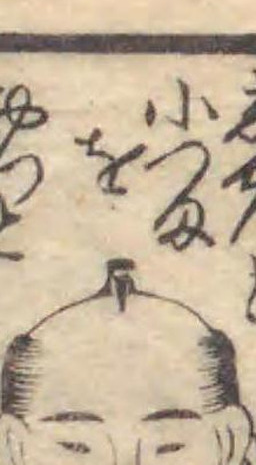おつと
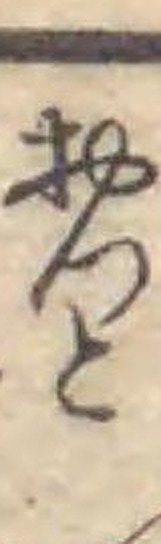おつと
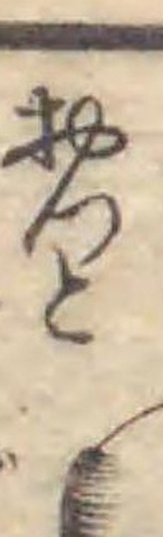おつと
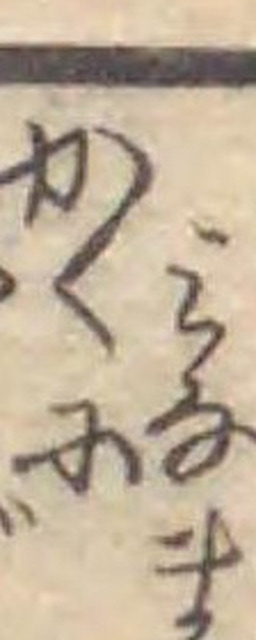かくに
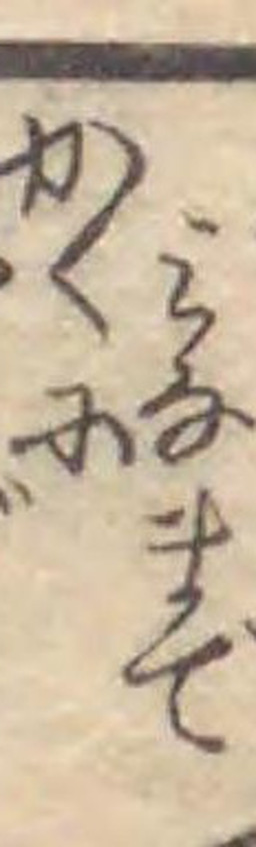かくに
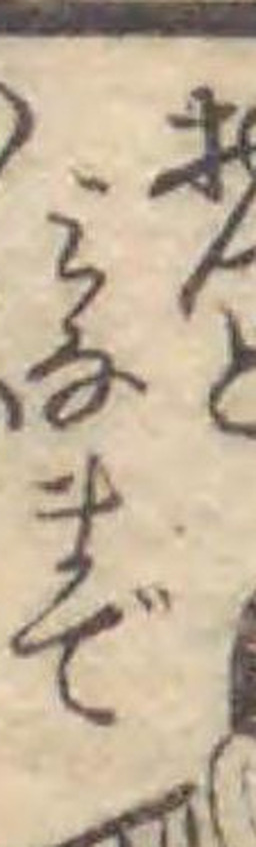みなまで
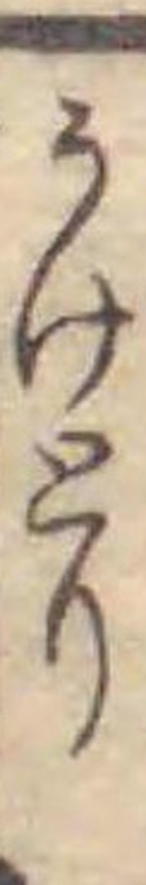うけとり
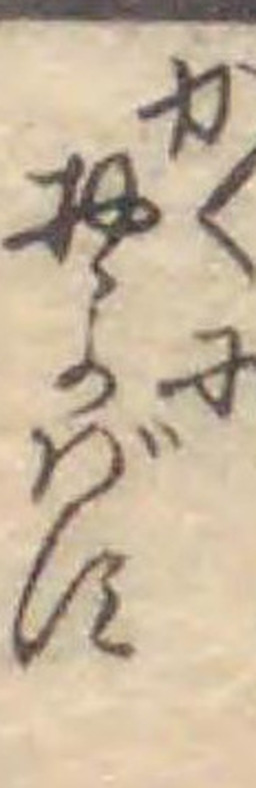およばす
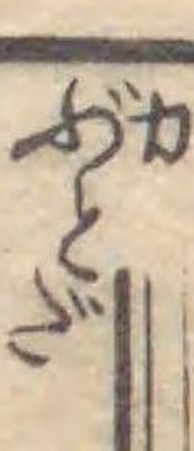ぶとだ
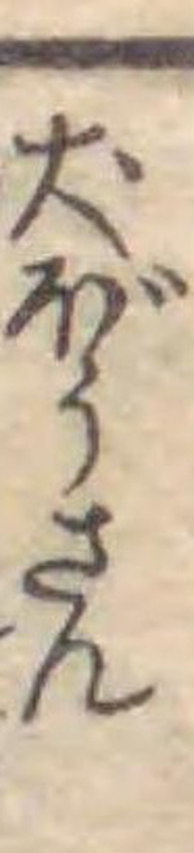犬ぼうさん
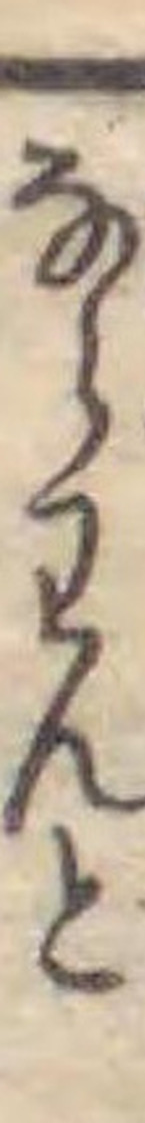ならわんと
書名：文武二道万石通 : 3巻
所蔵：国立国会図書館 National Diet Library, JAPAN
